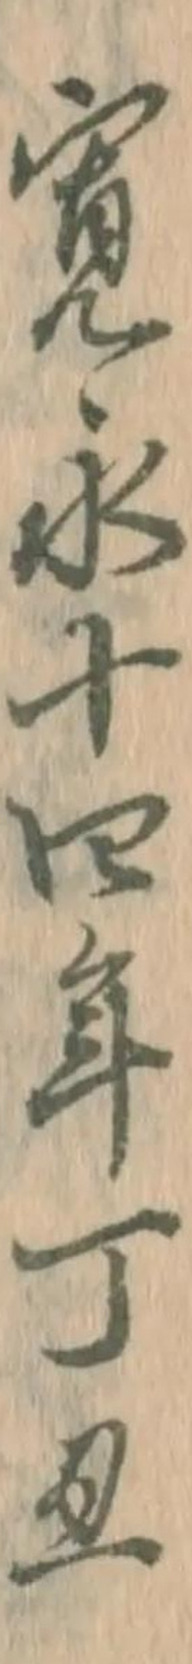寛永十四年丁丑
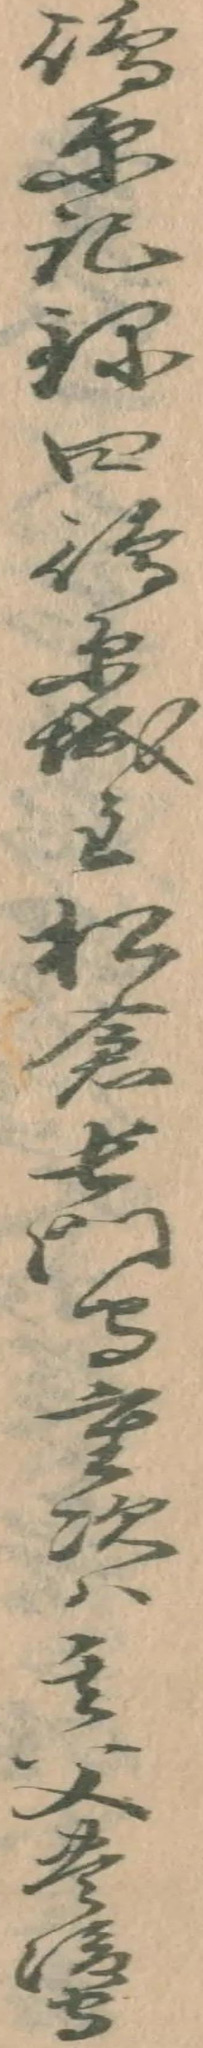島原記録曰島原城主松倉長門守重次は其父豊後守
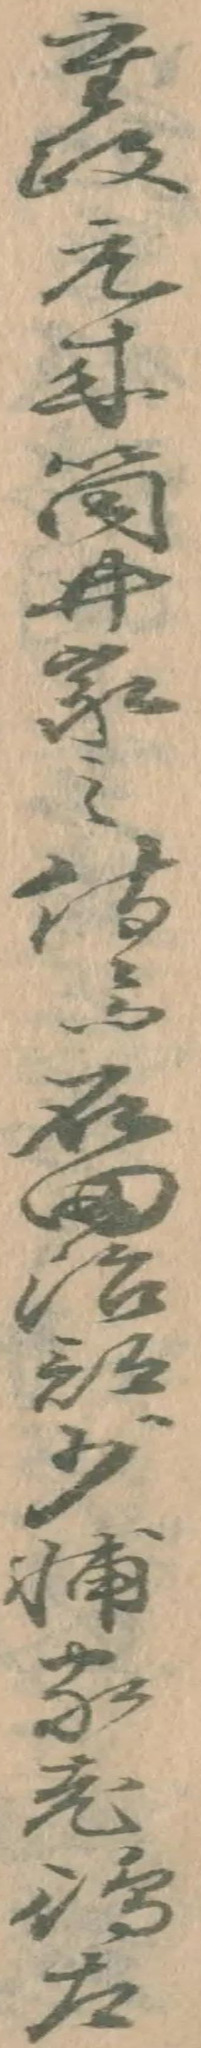重政元来筒井家之侍に而石田治部少輔家老島左
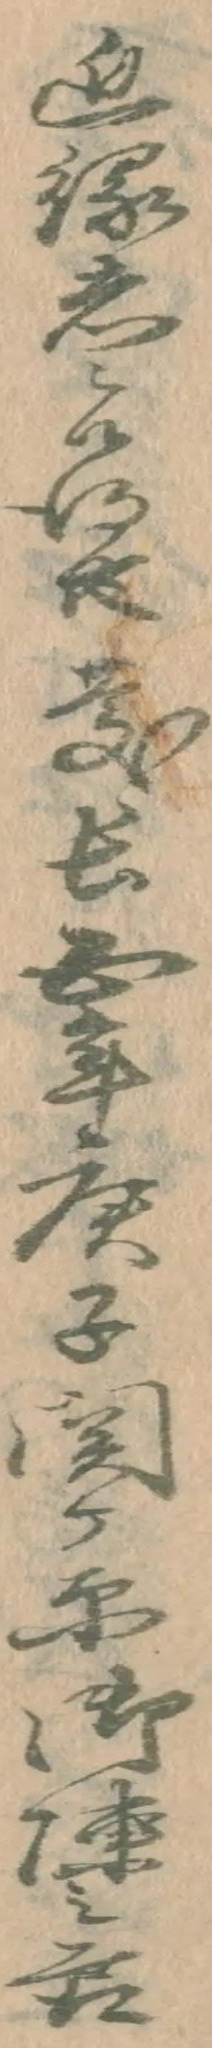近縁者に候得共慶長五年庚子関ヶ原御陣之節
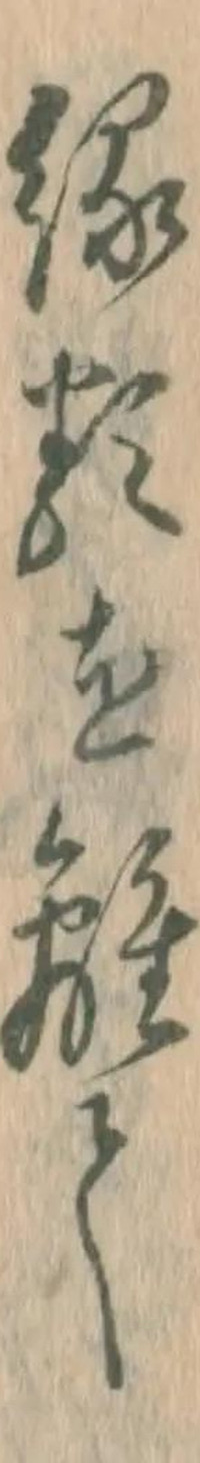縁類を離て
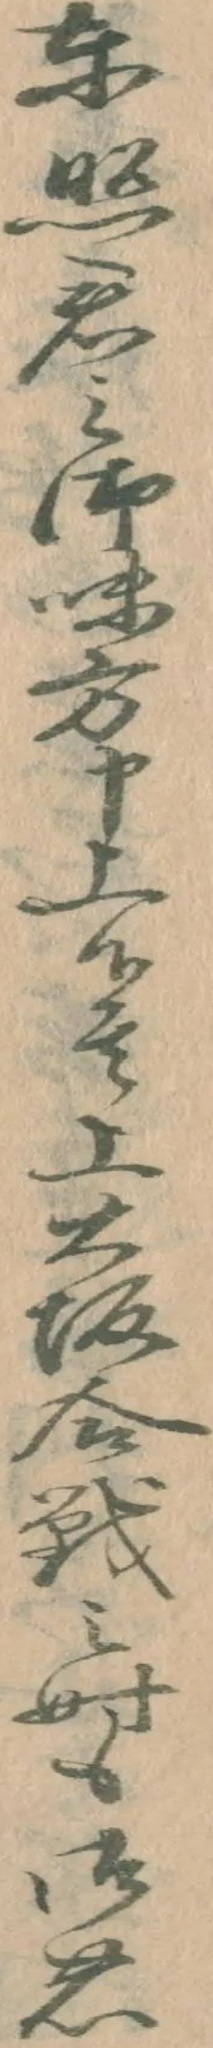東照君之御味方申上候其上大坂合戦之時も御忠
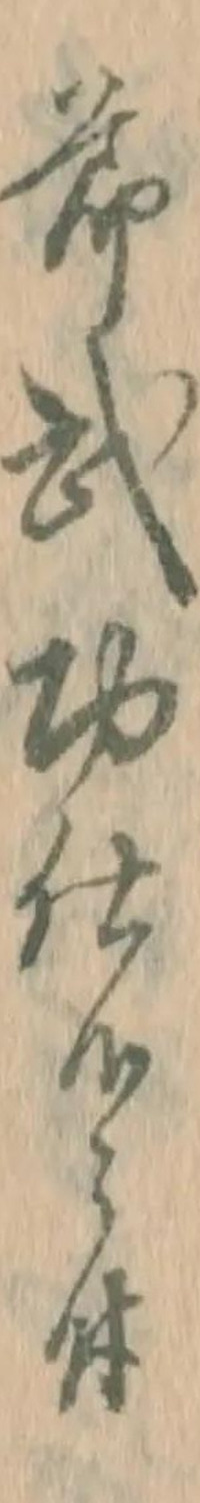節武功仕候に付
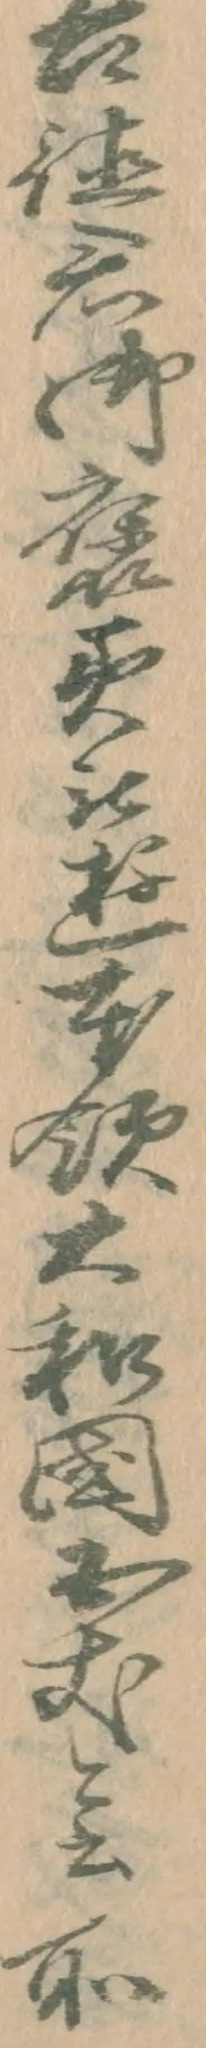台徳君御褒美被遊本領大和国五丈と云所

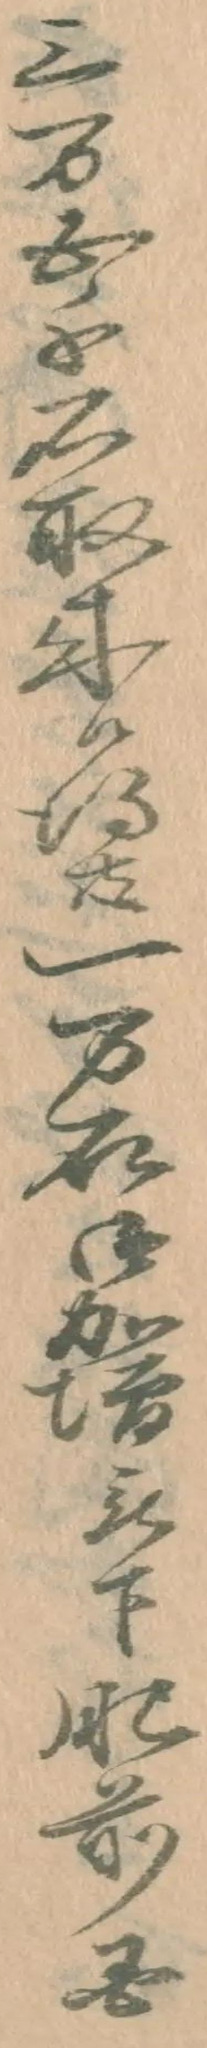三万五千石取来候得共一万石御加増被下肥前国
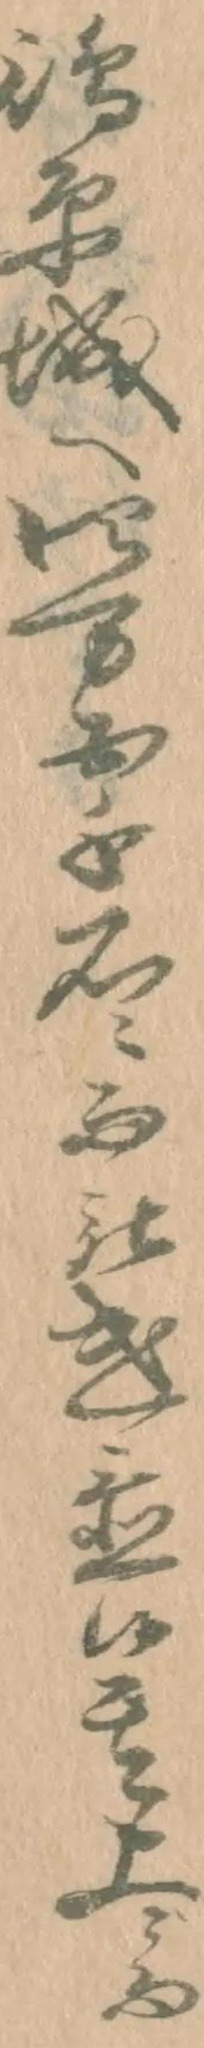島原城へ四万五千石に而被遣置候其上に而
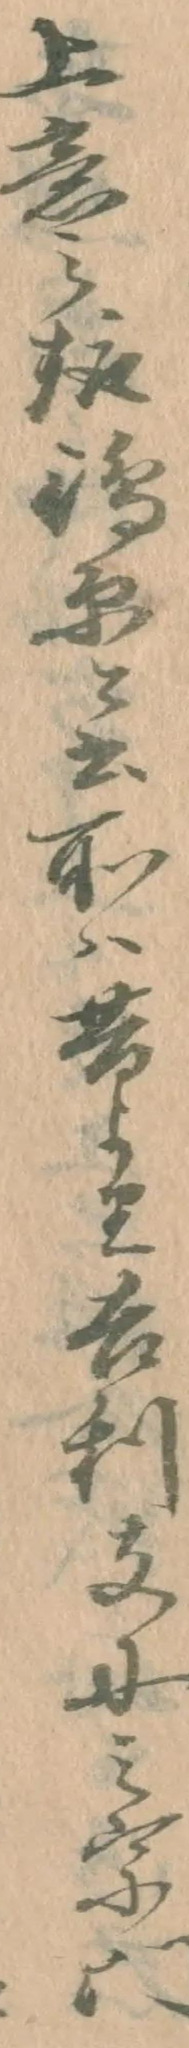上意之趣島原と云所は昔より吉利支丹之宗門
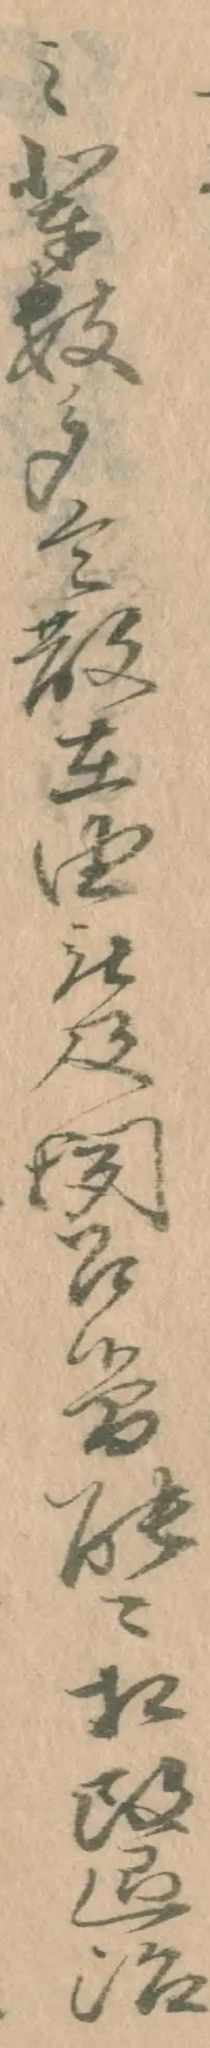之輩数多今散在由被及聞召候間能々相改退治
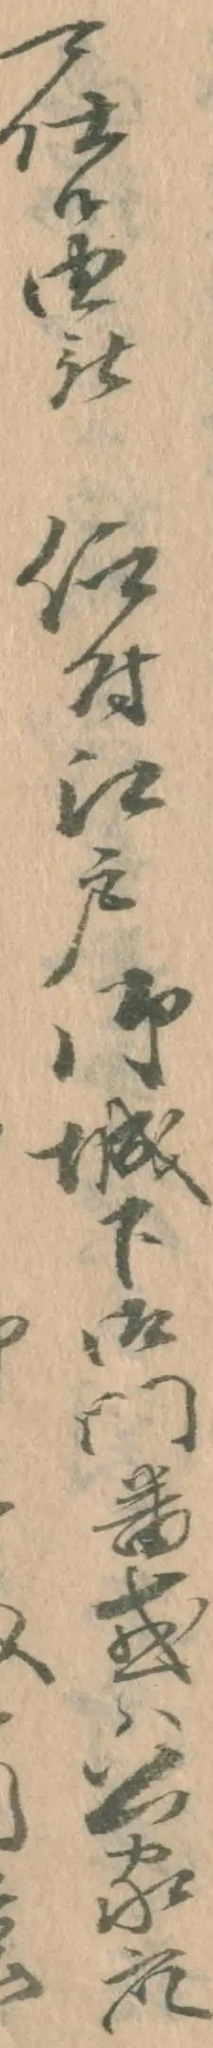可仕候由被仰付江戸御城下御門番或は公家衆
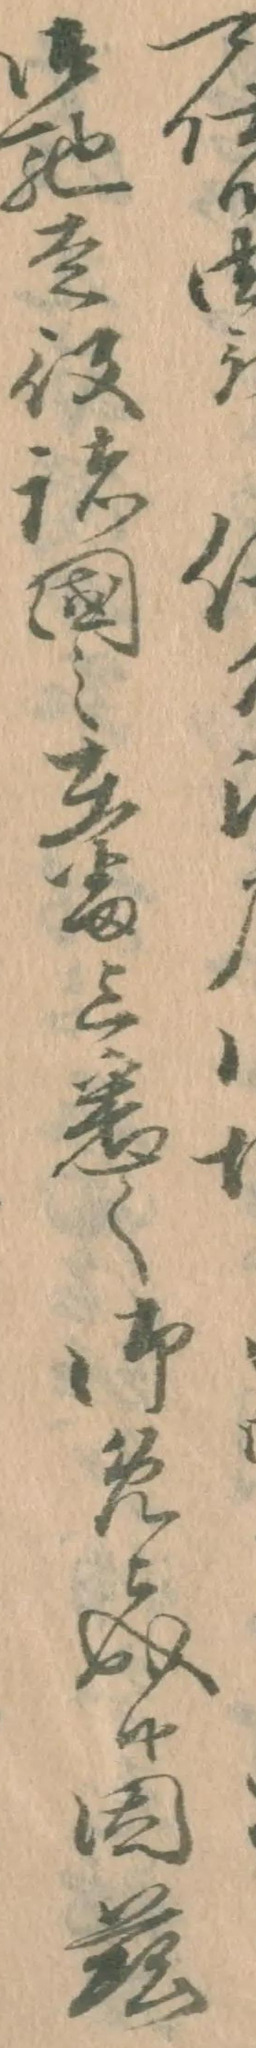御馳走役諸国之在番迄悉く御免被成候因茲
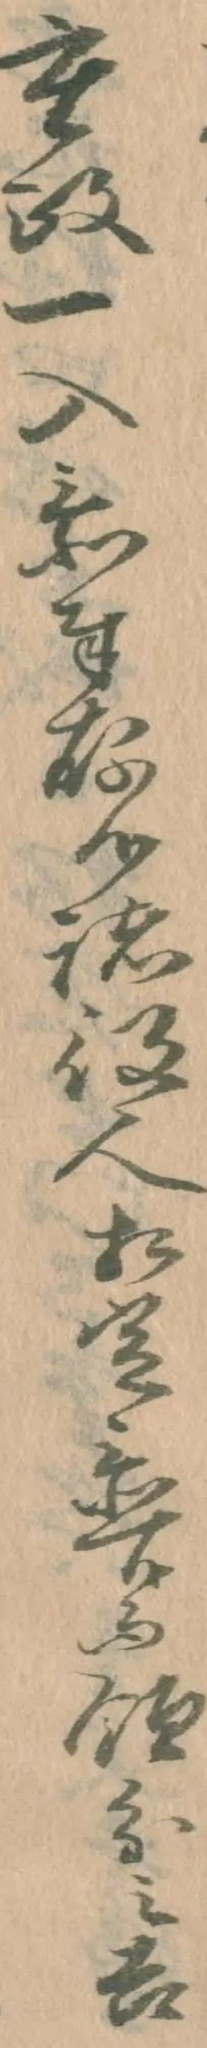重政一入忝奉存候諸役人相定置候而領分之吉
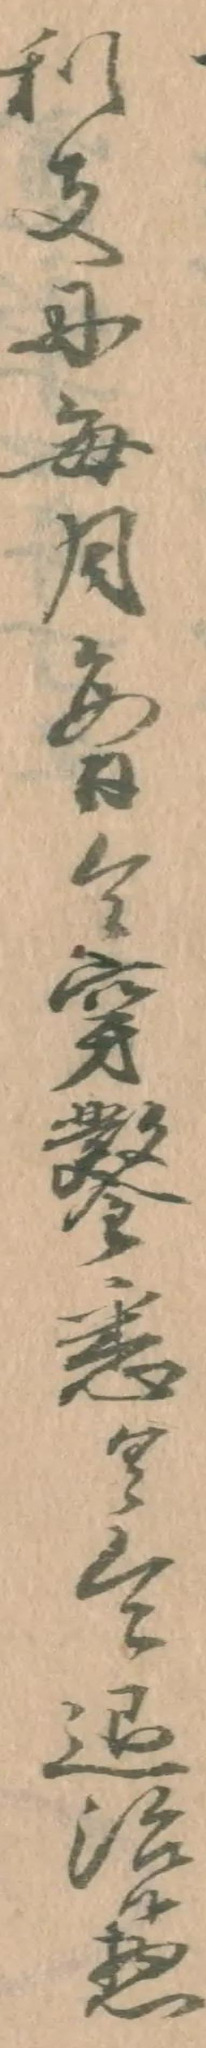利支丹毎月毎日令穿鑿悉く令退治候惣
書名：切支丹御退治記 49巻. [1]
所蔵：国立国会図書館 National Diet Library, JAPAN
